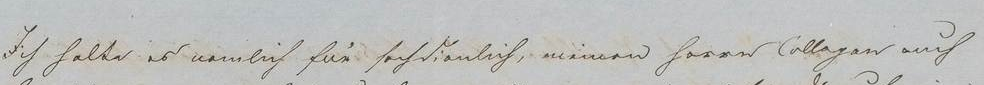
Ich halte es nemlich für sachdienlich, meinen Herrn Collegen auch
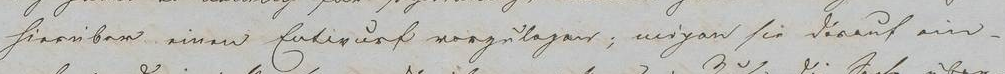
hierüber einen Entwurf vorzulegen; mögen sie darauf ein-
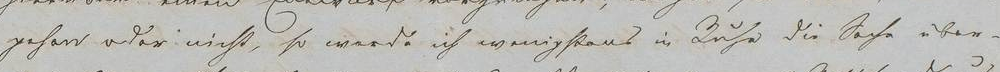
gehen oder nicht, so werde ich wenigstens in Ruhe die Sache über-
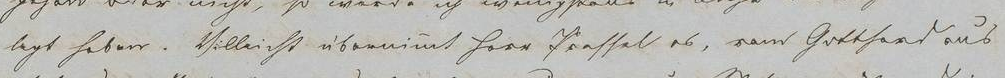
legt haben. Villeicht übernimmt Herr Pressel es, vom Gotthard aus
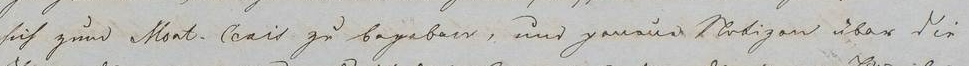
sich zum Mont-Cenis zu begeben, um genaue Notizen über die
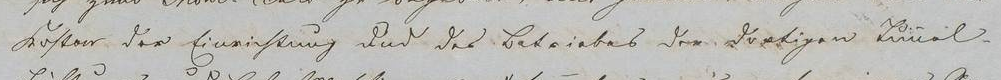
Kosten der Einrichtung und des Betriebes der dortigen Tunnel-,
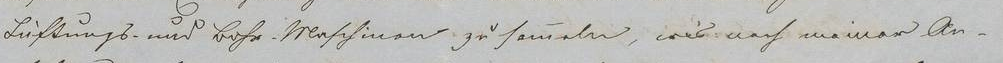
Lüftungs- und Bohr-Maschinen zu sammeln, was nach meiner An-
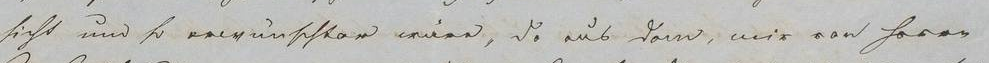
sicht um so erwünschter wäre, da aus dem, mir von Herrn
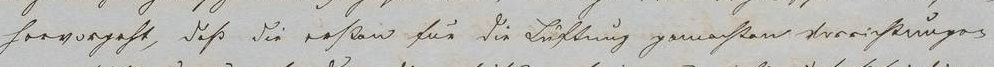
hervorgeht, daß die ersten für die Lüftung gemachten Vorrichtungen
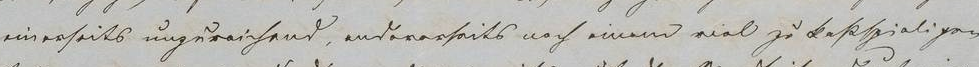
einerseits unzureichend, andererseits nach einem viel zu kostspieligen
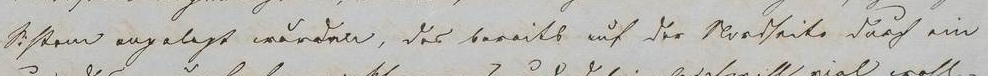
Sistem angelegt wurden, das bereits auf der Nordseite durch ein
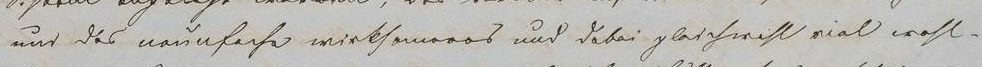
um das neunfache wirksameres und dabei gleichwohl viel wohl-
